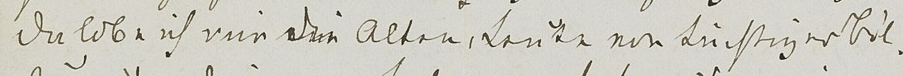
Da lobe ich mir die Alten, Leute von tüchtiger Bil-
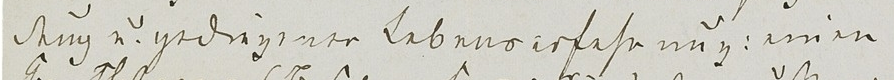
dung u. gediegener Lebenserfahrung: einen
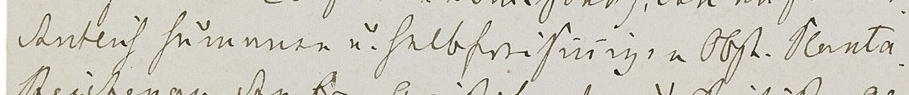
ordentlich humanen u. halbfreisinnigen Obst. Planta-
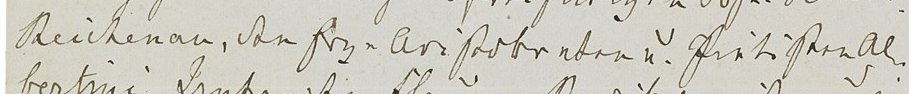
Reichenau, den Erz-Aristokraten u. Pietisten Al-
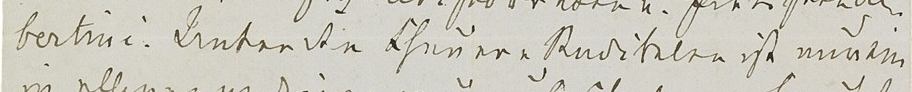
bertini. Unter den Churer-Radikalen ist nur ein
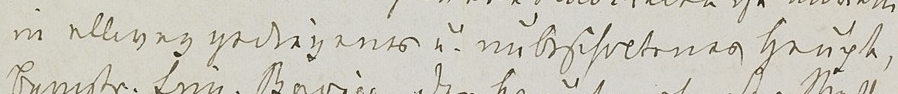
in allweg gediegenes u. unbescholtenes Haupt,
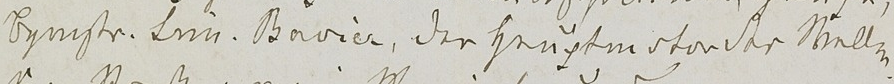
Bgmstr. Sim. Bavier, der Hauptmotor der Wallen-
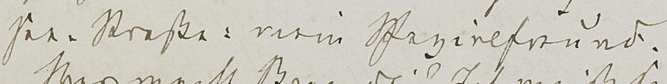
see-Straße: mein Specialfreund.
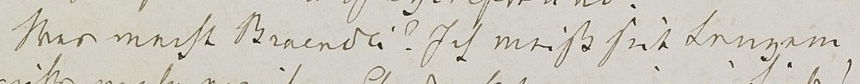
Was macht Braendli? Ich weiß seit Langem
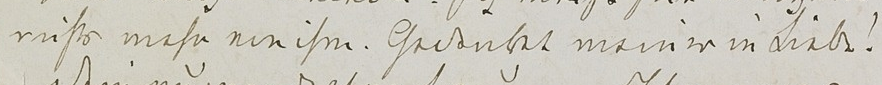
nichts mehr von ihm. Gedenket meiner in Liebe!
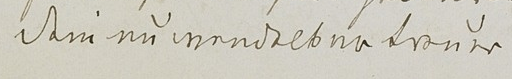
Dein unwandelbar treuer
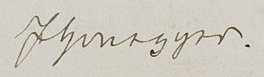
J Honegger.
